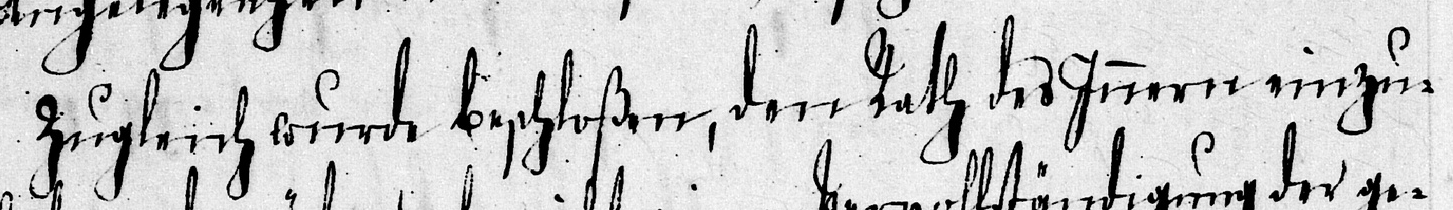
Zugleich wurde beschloßen, den Rath des Innern einzu¬
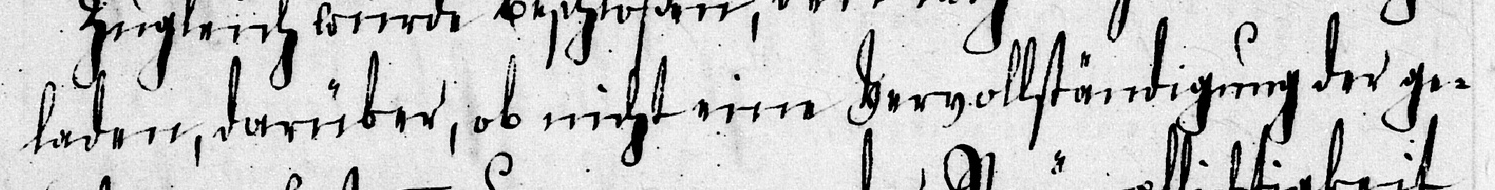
laden, darüber, ob nicht eine Vervollständigung der ge¬
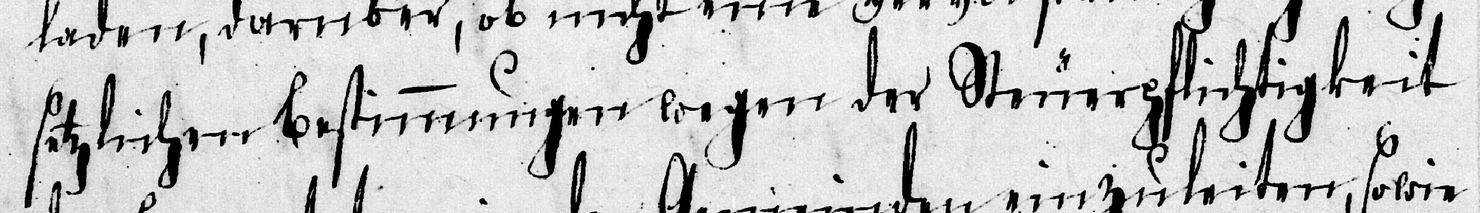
setzlichen Bestimmungen wegen der Steuerpflichtigkeit
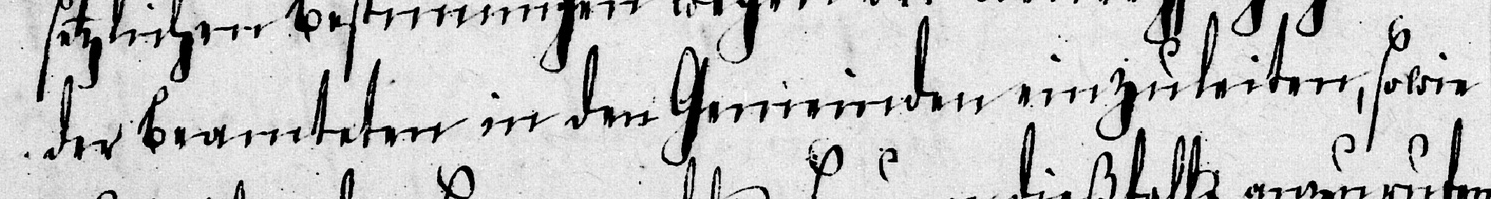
der Beamteten in den Gemeinden einzuleiten, sowie
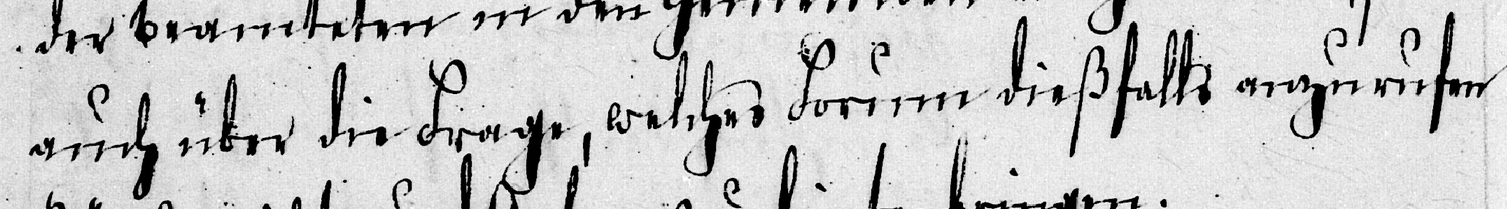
auch über die Frage, welches Forum dießfalls anzurufen
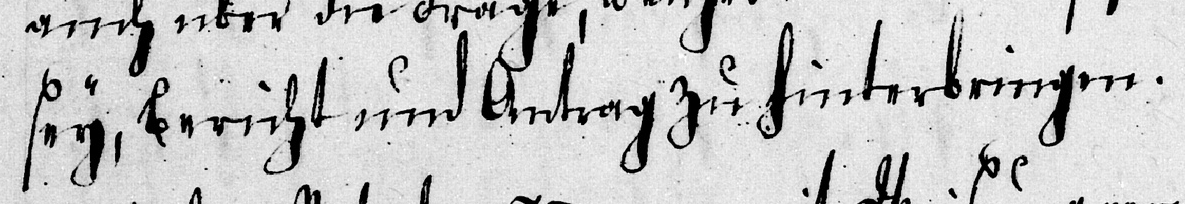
sey, Bericht und Antrag zu hinterbringen.
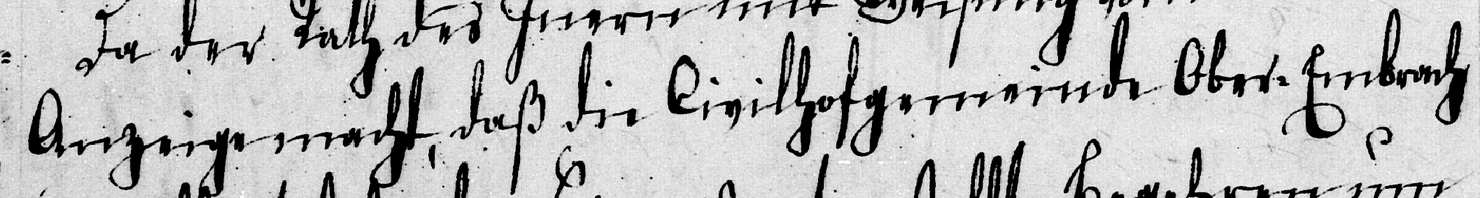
Anzeige macht, daß die Civilhofgemeinde Ober-Embrach
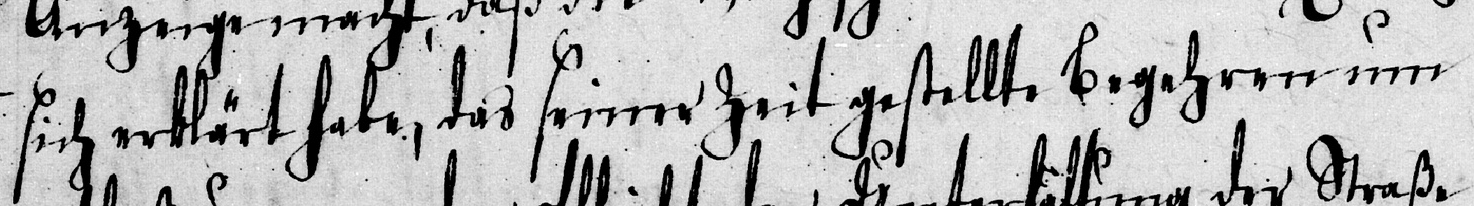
sich erklärt habe, das seiner Zeit gestellte Begehren um
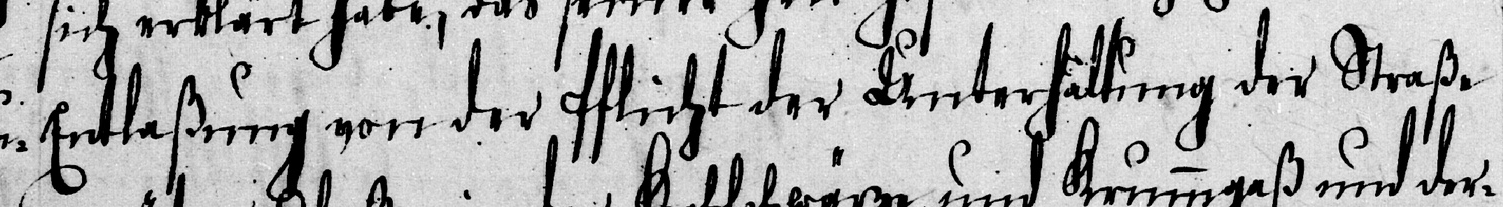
Entlaßung von der Pflicht der Unterhaltung der Straße
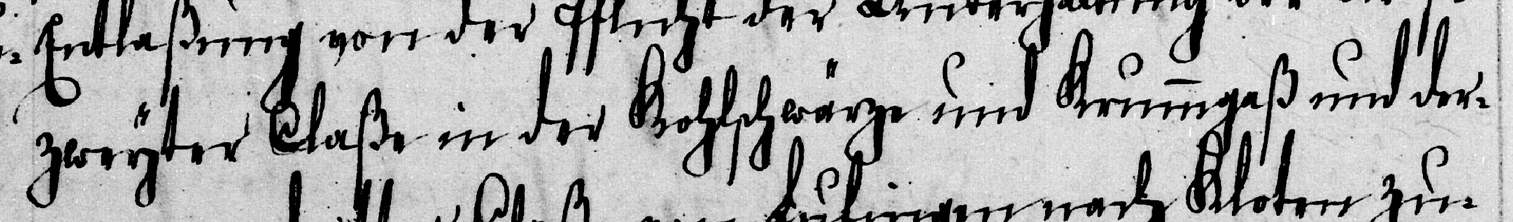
zweyter Claße in der Kohlschwärze und Krummgaß und der¬
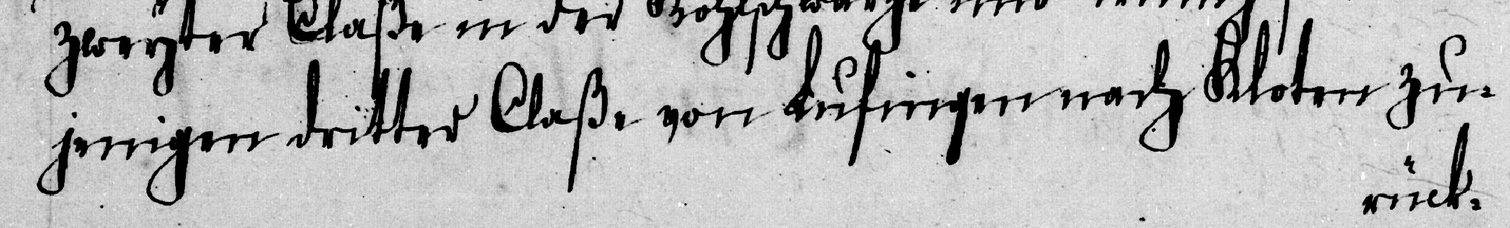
jenigen dritter Claße von Lufingen nach Kloten zu-
